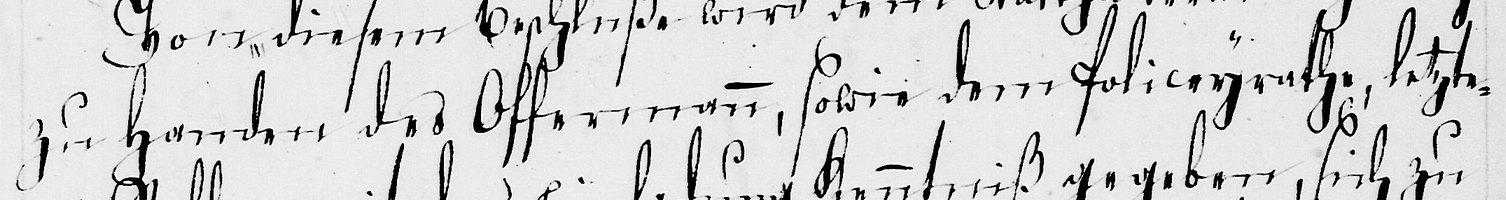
zu Handen des Offermann, sowie dem Policeyrathe, letzte¬
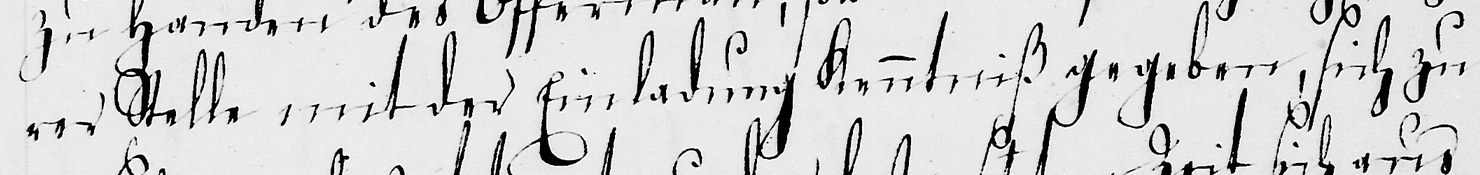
rer Stelle mit der Einladung Kenntniß gegeben, sich zu
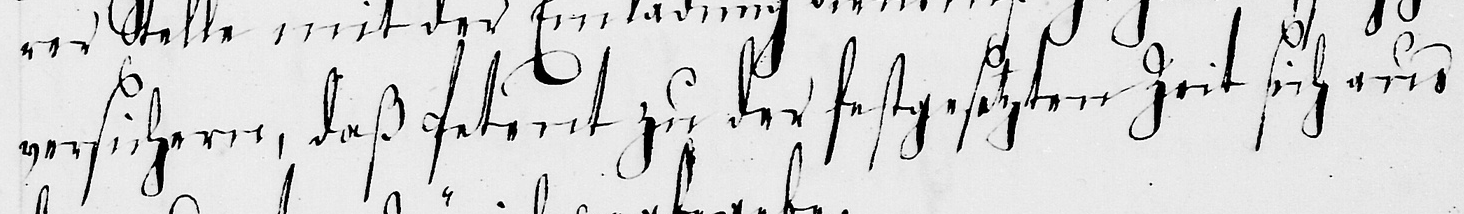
versichern, daß Petent zu der festgesetzten Zeit sich aus
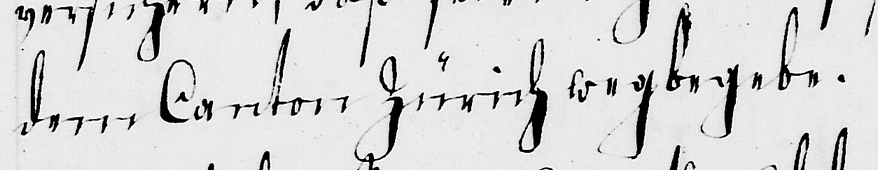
dem Canton Zürich wegbegeben.
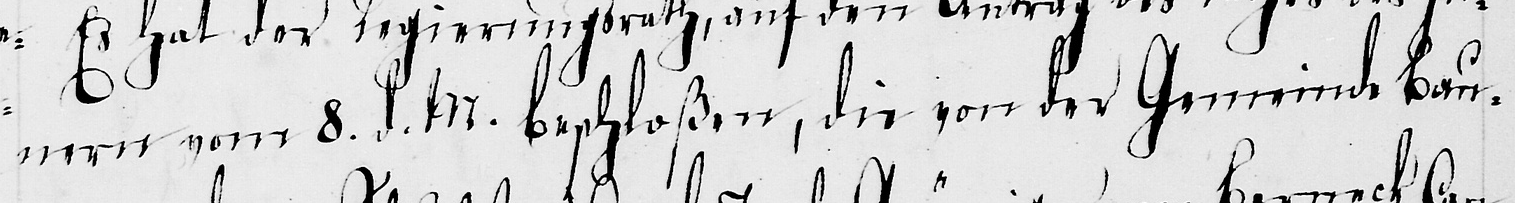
nern vom 8. d. M. beschloßen, die von der Gemeinde Bau¬
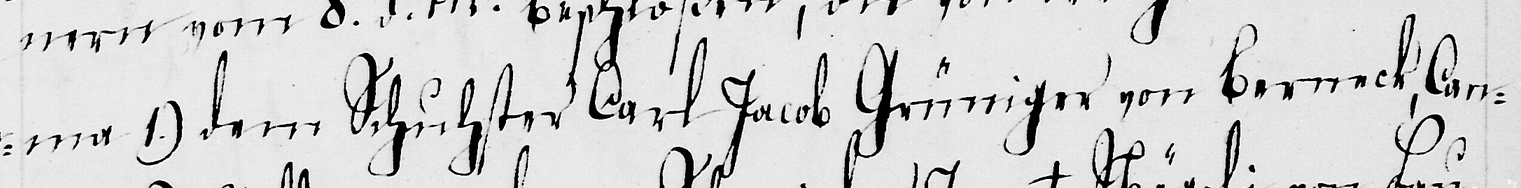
ma 1.) dem Schuhster Carl Jacob Grüniger von Berneck, Can¬
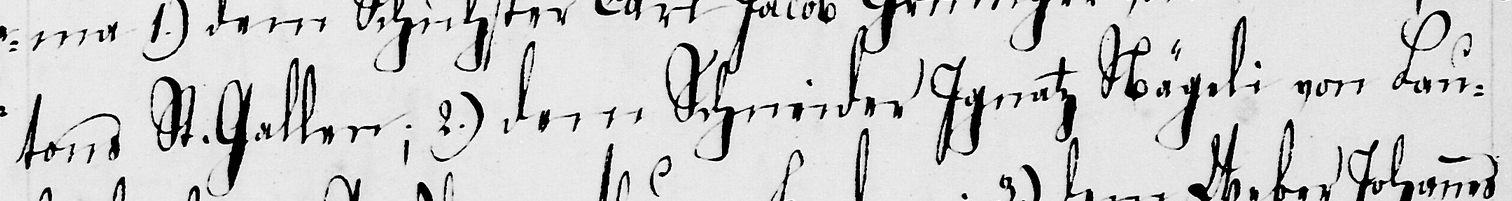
ton St. Gallen; 2.) dem Schneider Ignatz Nägeli von Fau¬
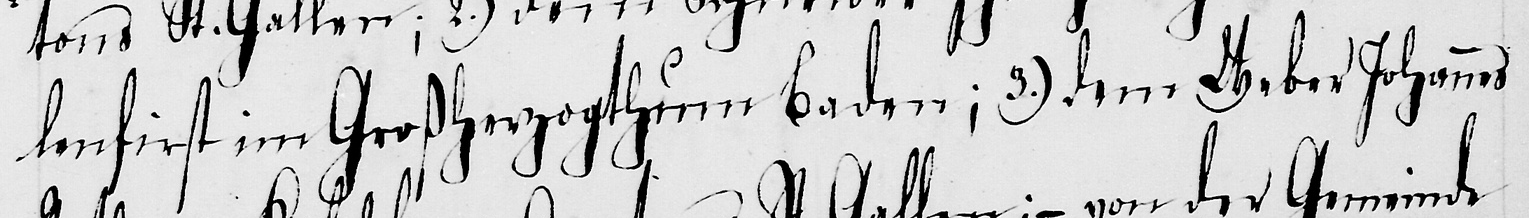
lenfirst im Großherzogthum Baden; 3.) dem Weber Johann¬
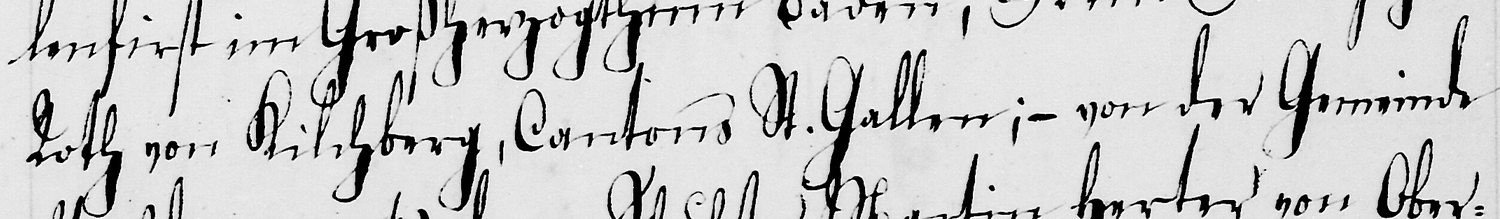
Roth von Kilchberg, Cantons St. Gallen; – von der Gemeinde
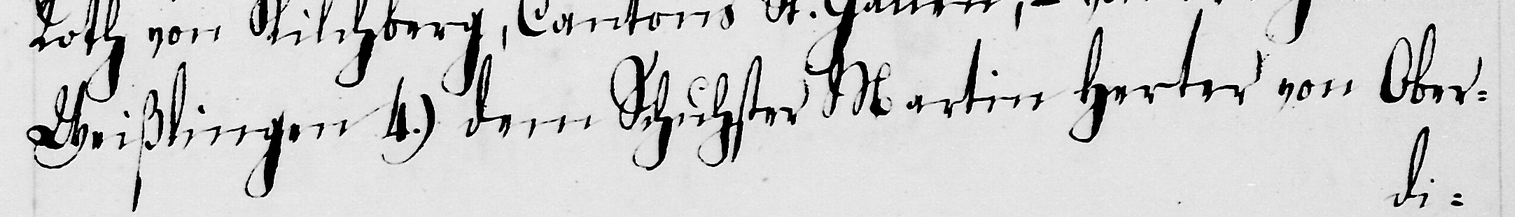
Weißlingen 4.) dem Schuhster Martin Herter von Ober-
